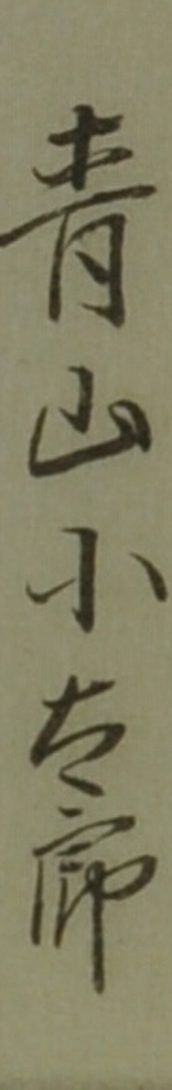青山小太郎
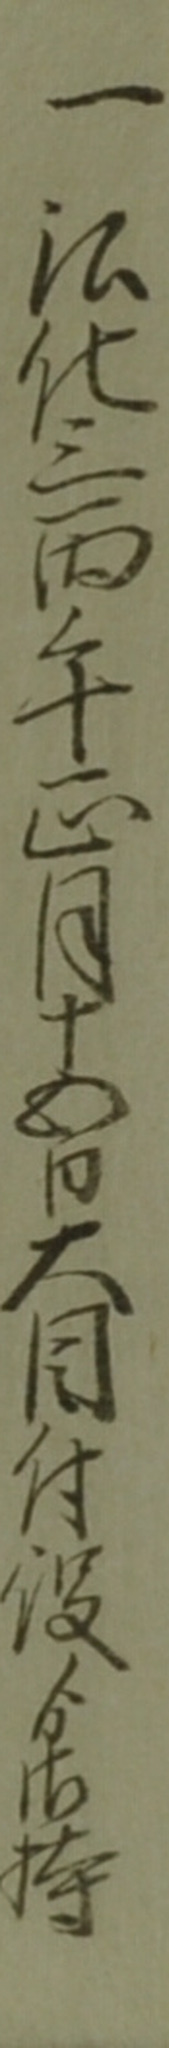一弘化三丙午正月十五日大目付役ゟ御持
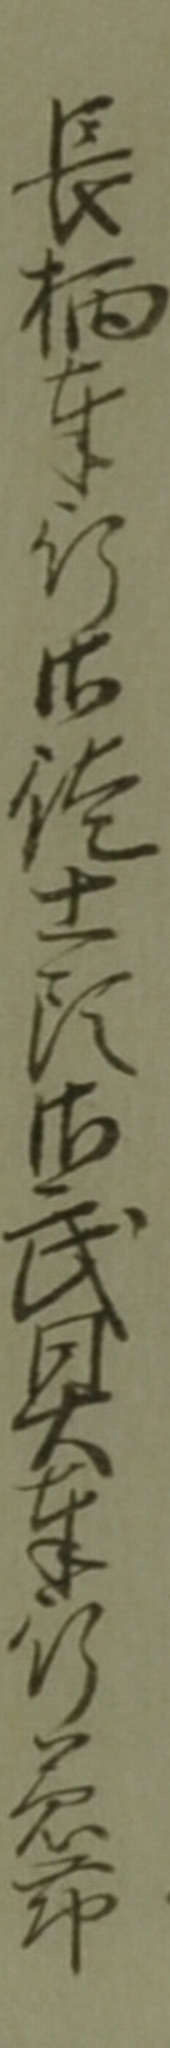長柄奉行御徒士頭御武具奉行兼帯
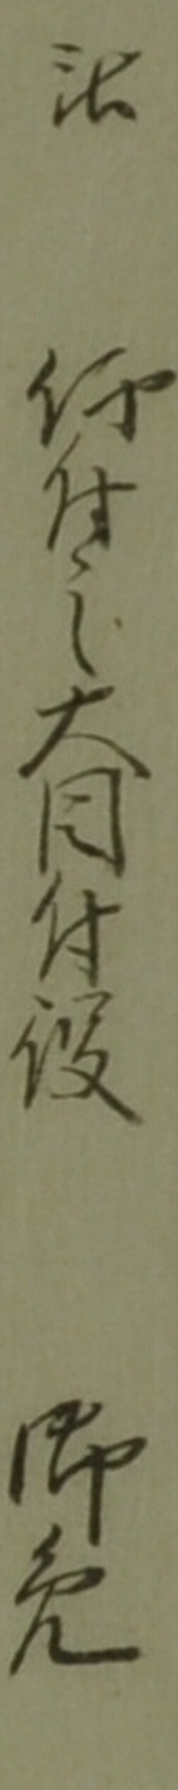被仰付之大目付被御免
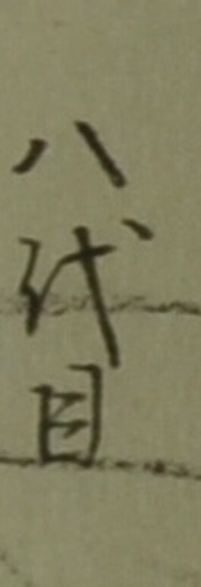八代目
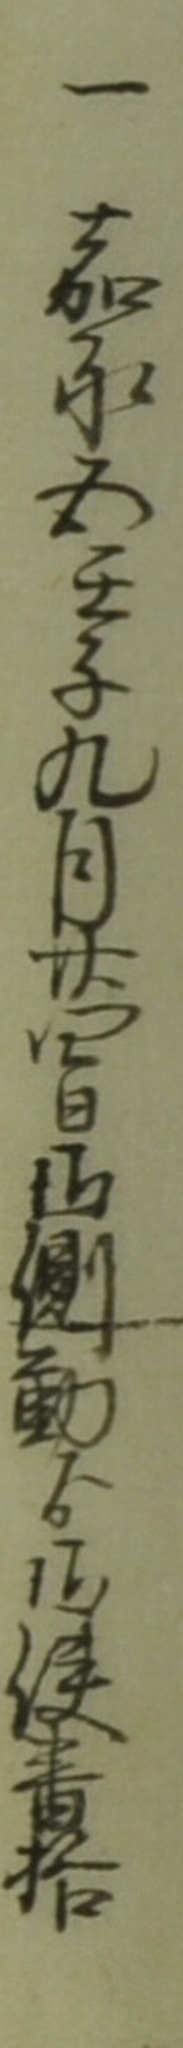一嘉永五壬子九月廿四日御側勤ゟ御使番格

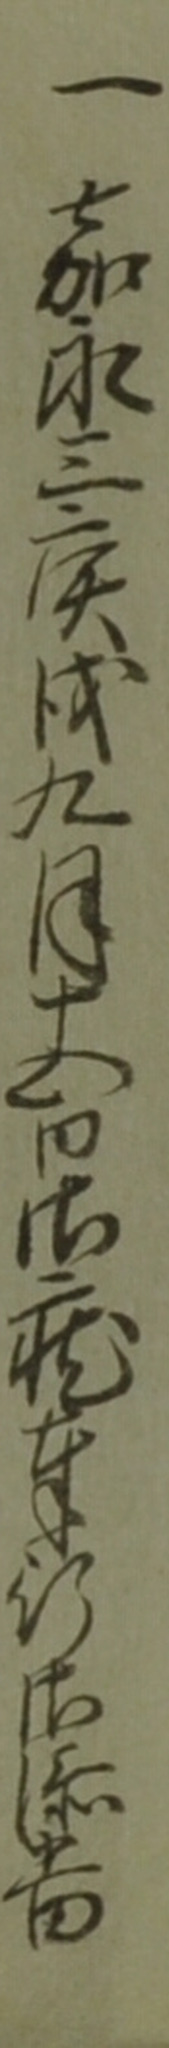一嘉永三庚戌九月十五日御蔵奉行御添番
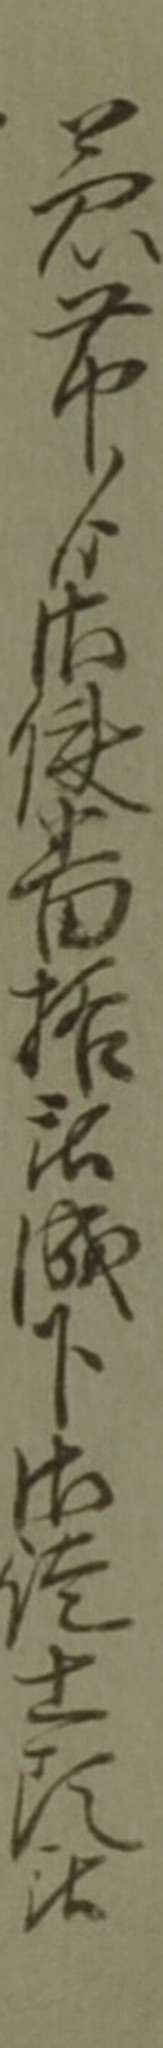兼帯ゟ御使番格被成下御徒士頭被
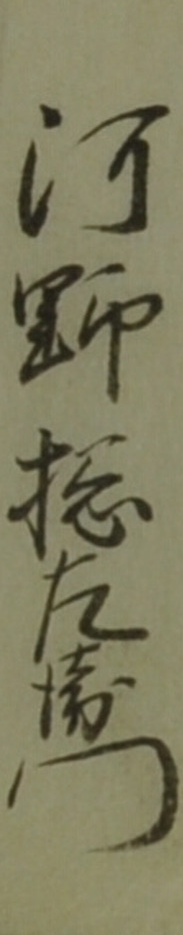河野捴左衛門
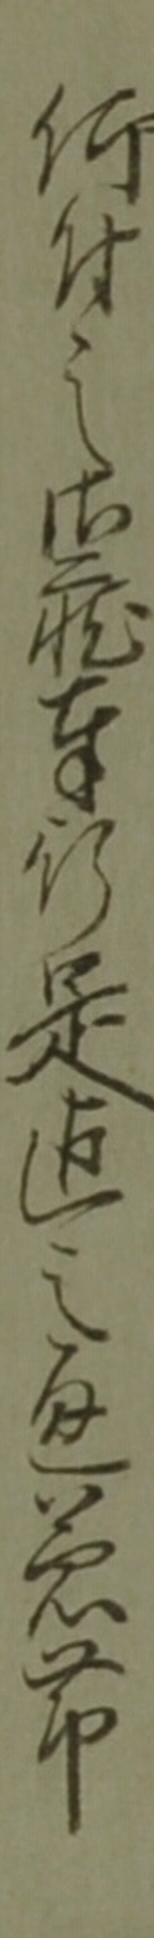仰付之御蔵奉行是迄之通兼帯

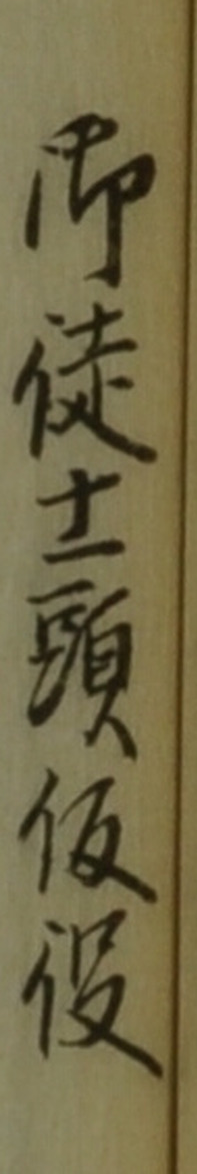御徒士頭仮役
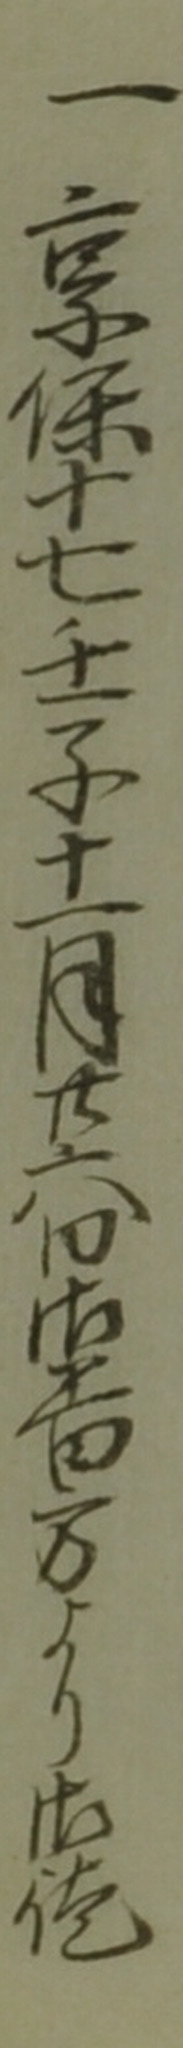一享保十七壬子十一月廿六日御番方より御徒
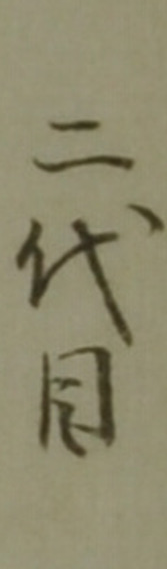二代目
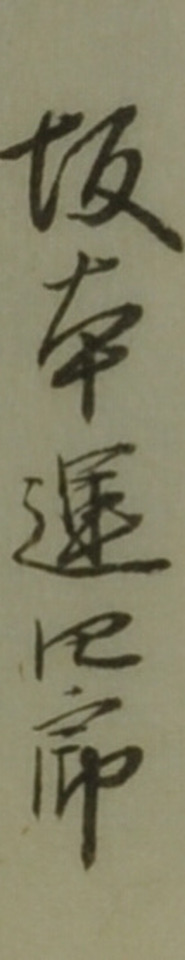坂本運四郎
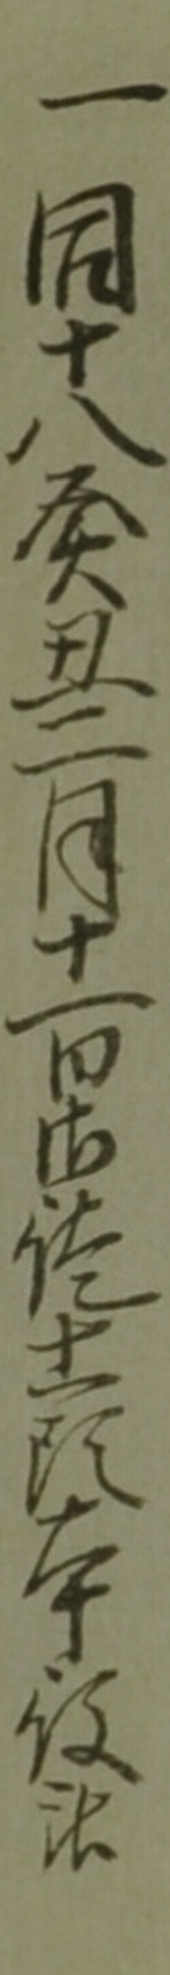一同十八癸丑二月十一日御徒士頭本役被
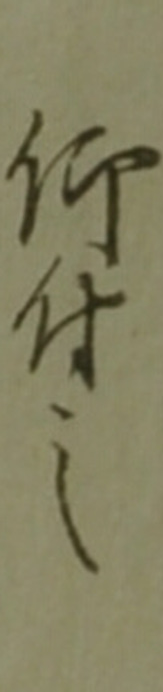仰付之
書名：諸御役代々録（六）
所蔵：伊那市立高遠町図書館・合同会社AMANE
